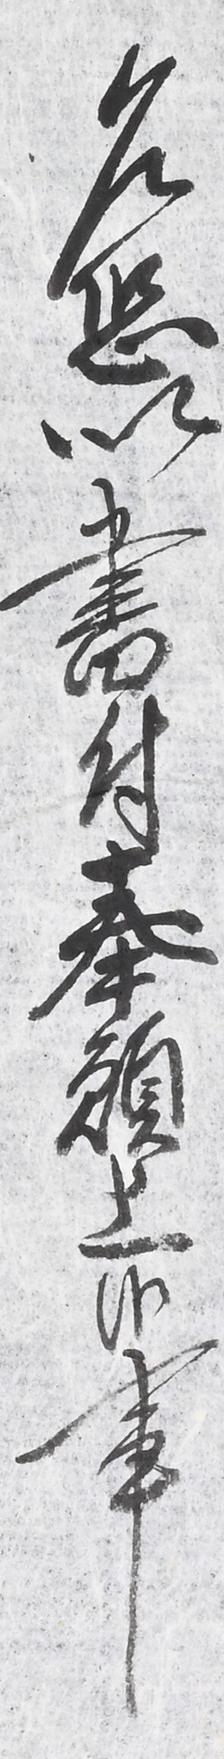乍恐以書付奉願上候事
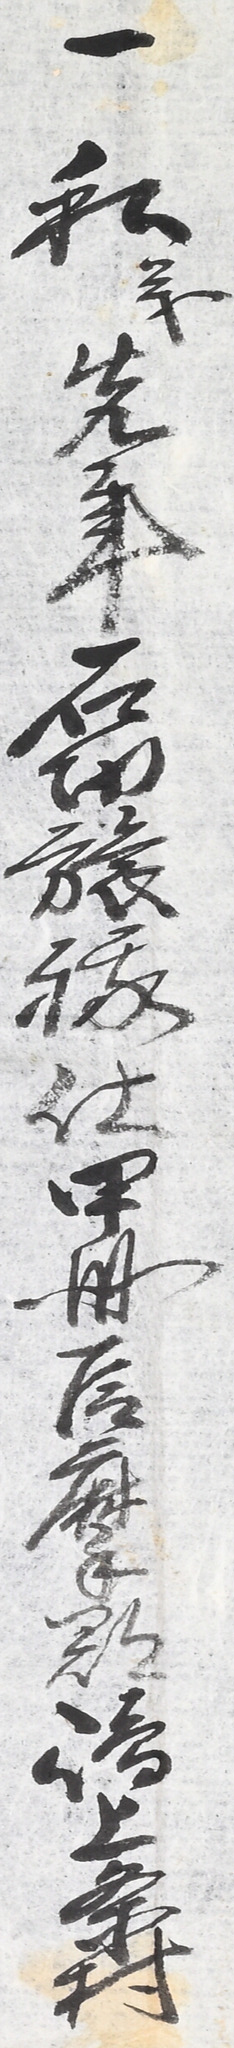一私義先年石切旅稼仕甲州巨摩郡嶋上条村
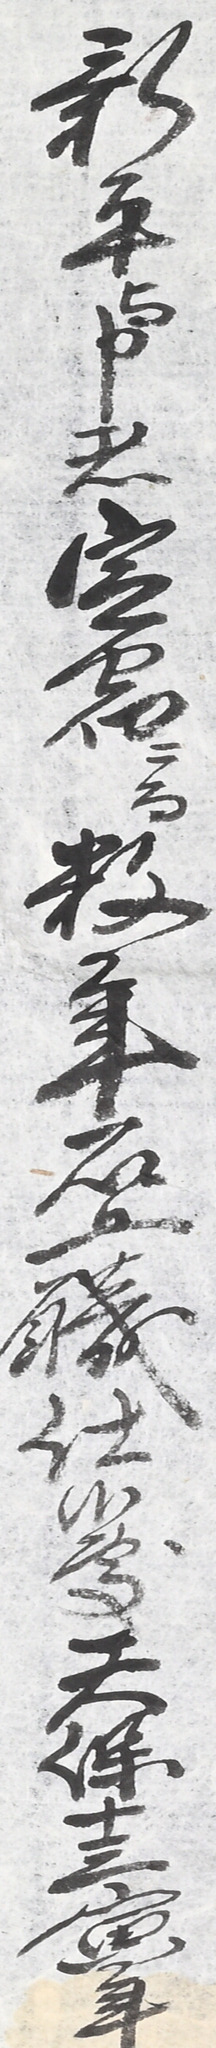新平と申者定宿にて数年石工職仕候処天保十三寅年
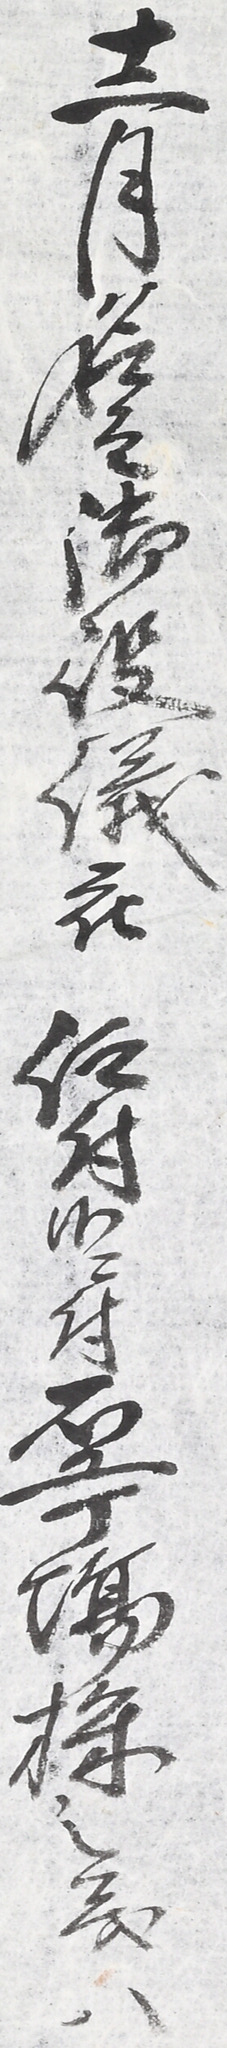十二月名主御役儀被仰付候に付石工丁場株之義は
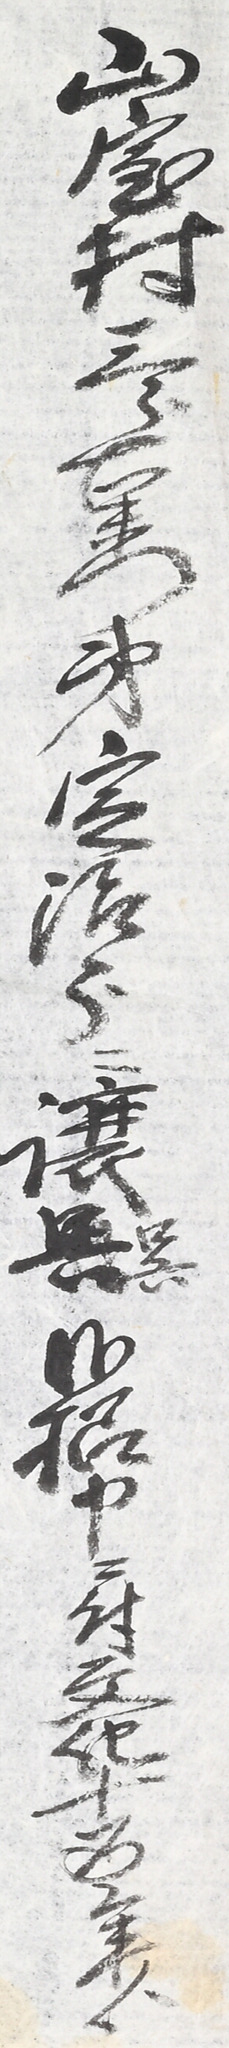山室村三郎右衛門弟定治郎に譲呉候様申に付文化十酉年ゟ
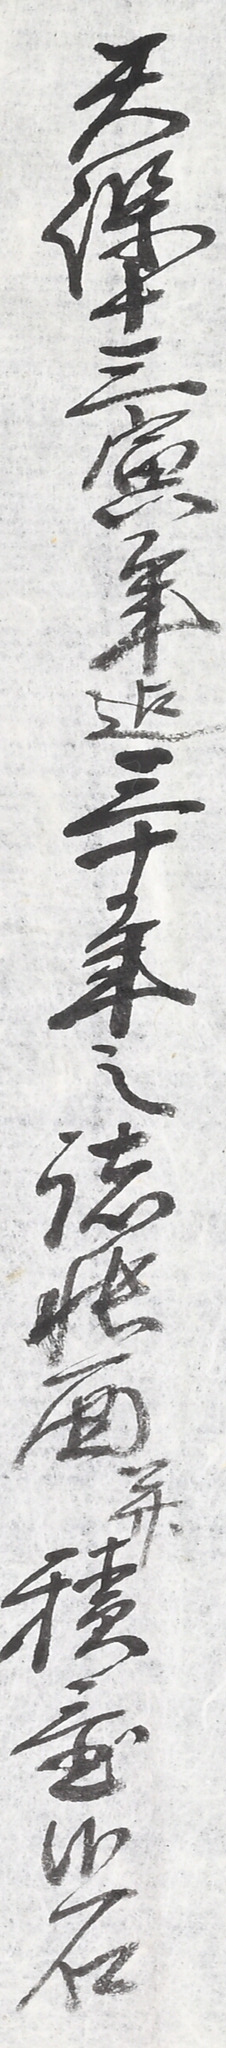天保十三寅年迄三十年之諸帳面幷積置候石
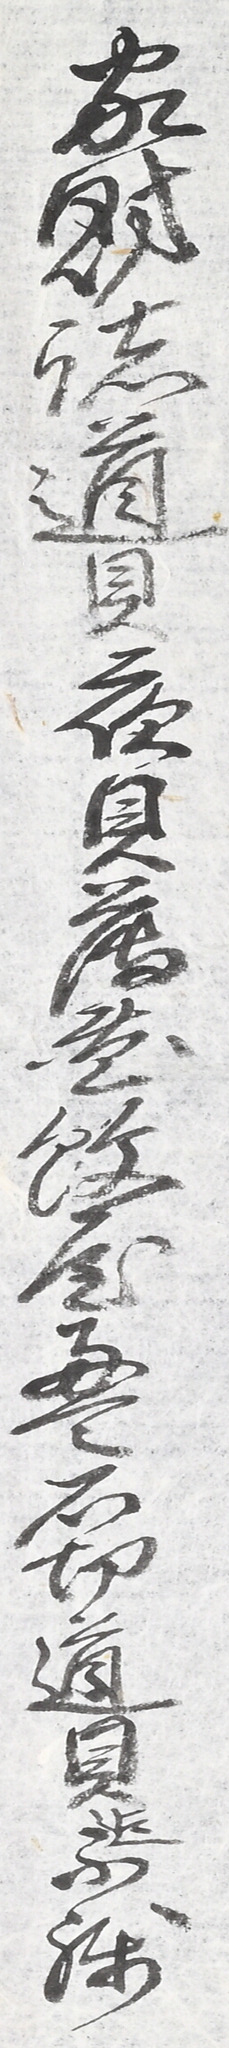家財諸道具夜具蒲団蚊屋畳石切道具迄不残
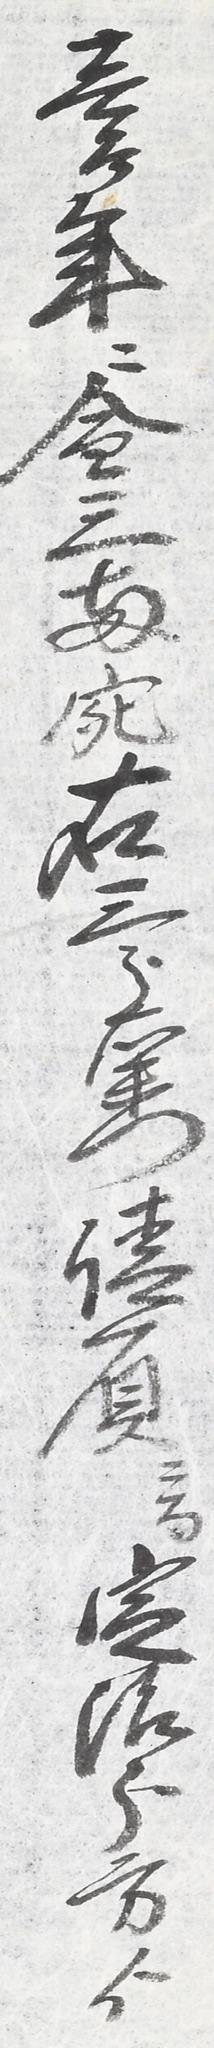壱ヶ年に金三両宛右三郎右衛門請負にて定治郎方ゟ
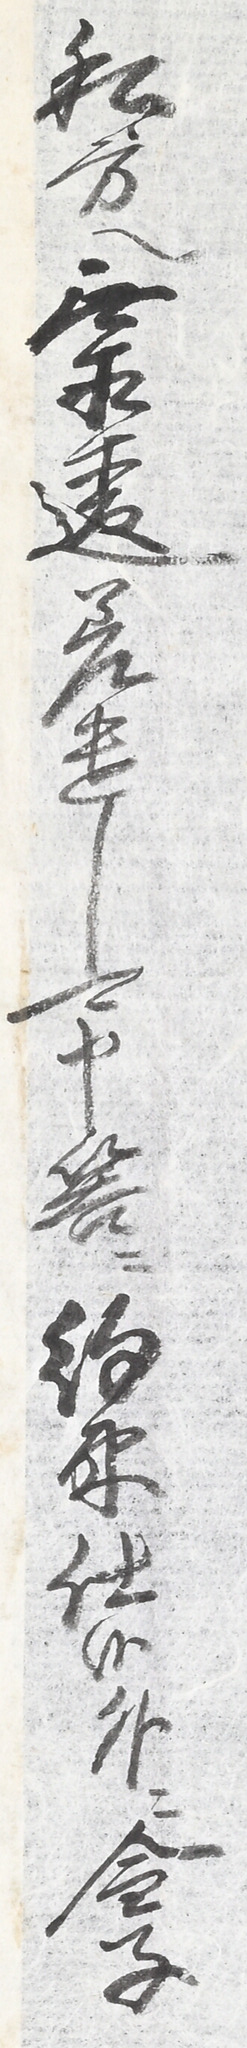私方へ無相違差遣し可申筈に約束仕候外に金子
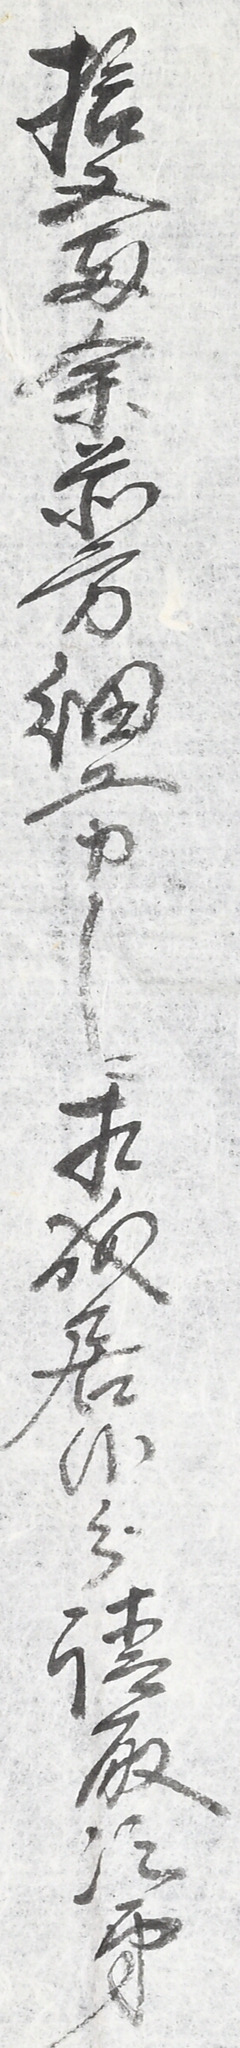拾五両余前方細工かしに相成居候分請取次第
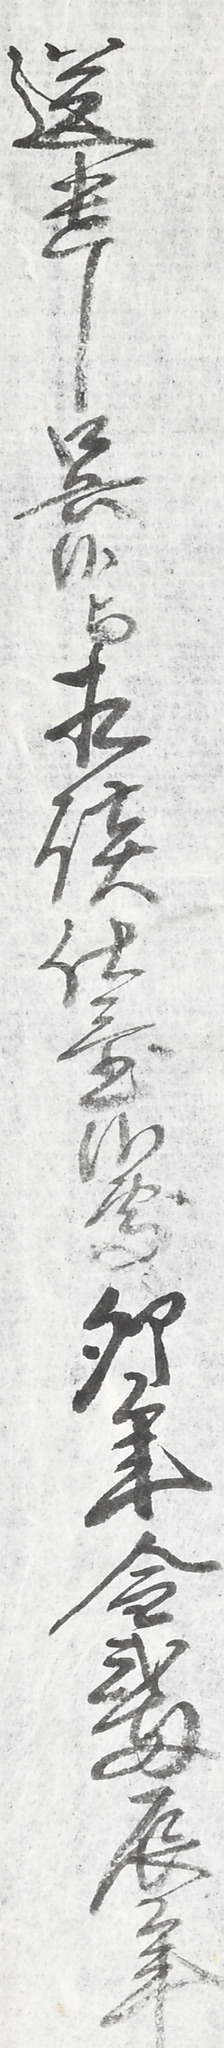送遣し呉候と相談仕置候処卯年金弐両辰年
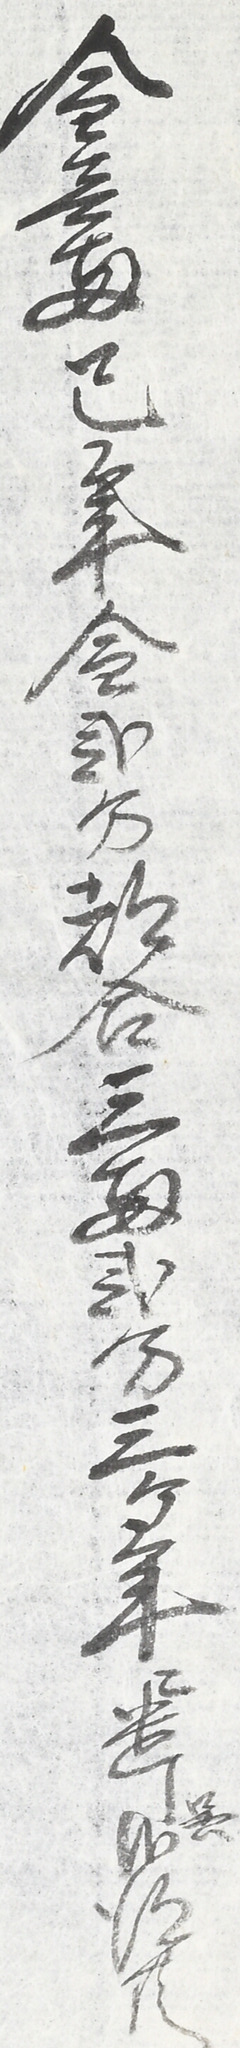金壱両巳年金弐分都合三両弐分三ヶ年に遣し呉候得共
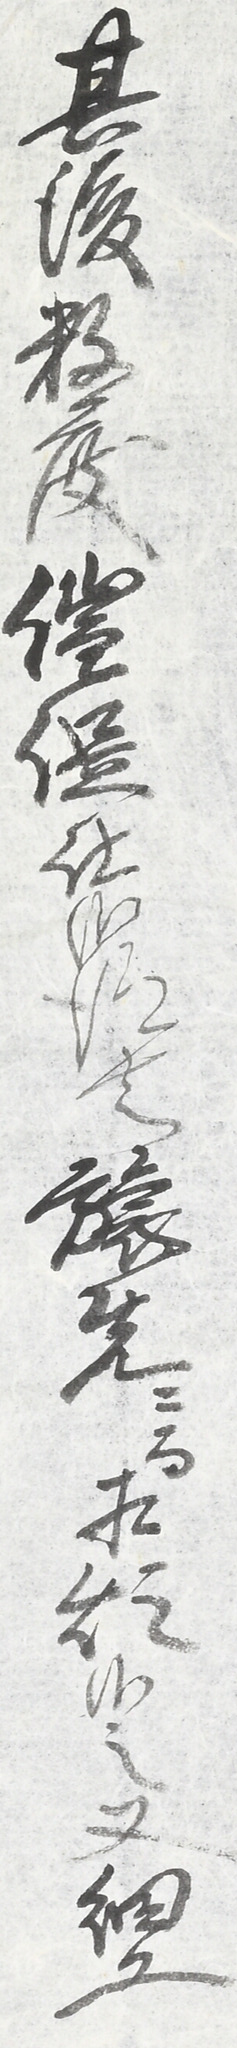其後数度催促仕候得共旅先にて相煩候之又細工
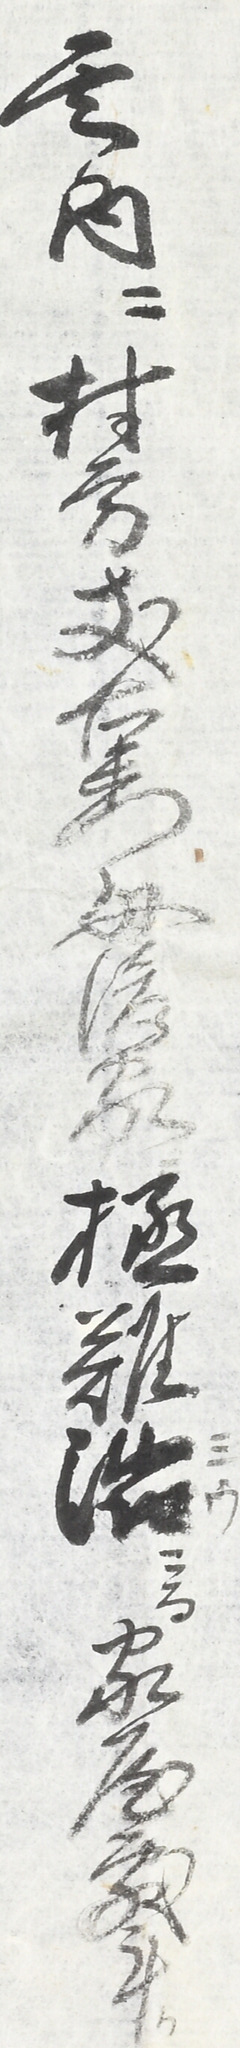其内に村方丈右衛門母後家極難渋にて家屋敷計り
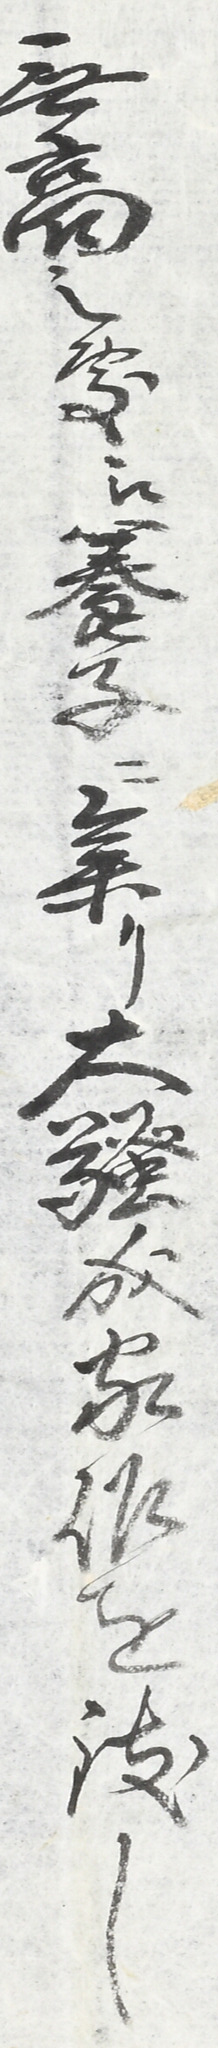無高之処え養子に参り大騒成家作を致し

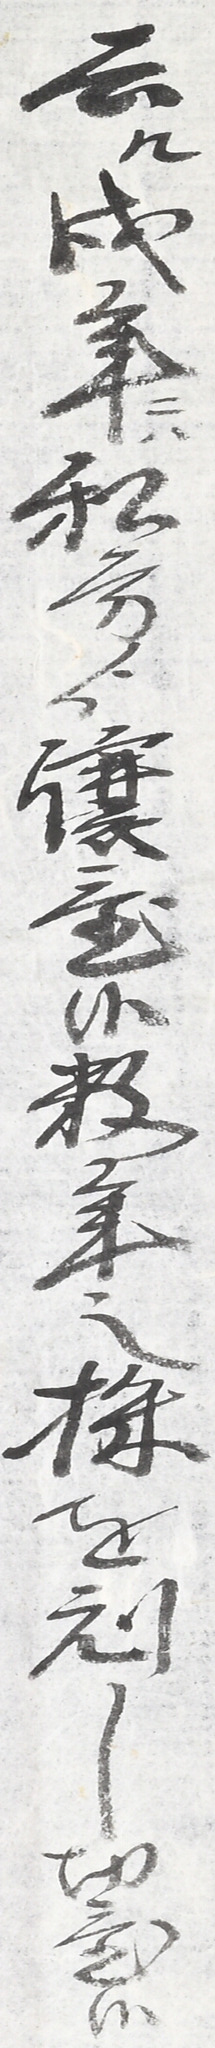去ル戌年には私方ゟ譲置候数年之株を割し切置候
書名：乍恐以書付奉願上候事
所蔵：伊那市立高遠町図書館・合同会社AMANE
